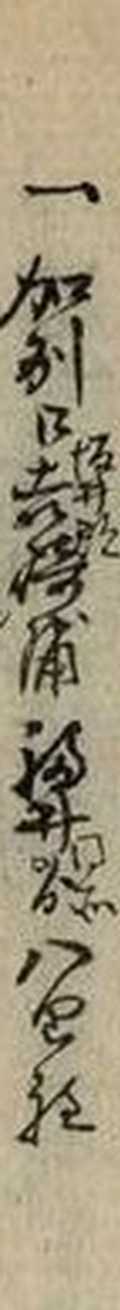一加州口坂井郡吉崎浦福井同所ゟ八里程
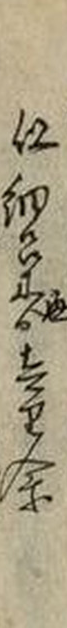但細呂木ゟ壱里余
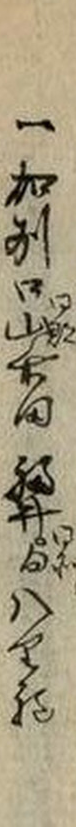一加州口同郡山竹田福井同所ゟ八里程
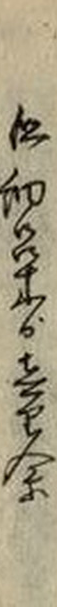但細呂木ゟ壱里余
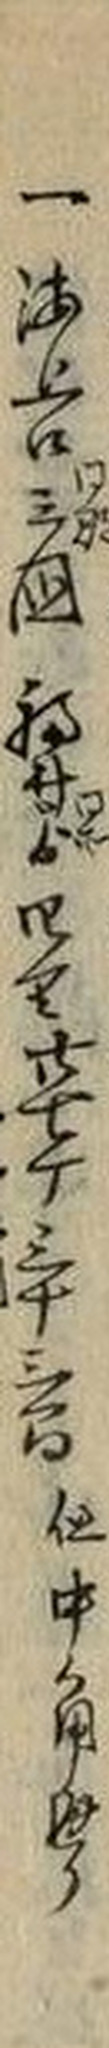一海上口同郡三国福井同所ゟ四里廿七丁三十三間但中角通り
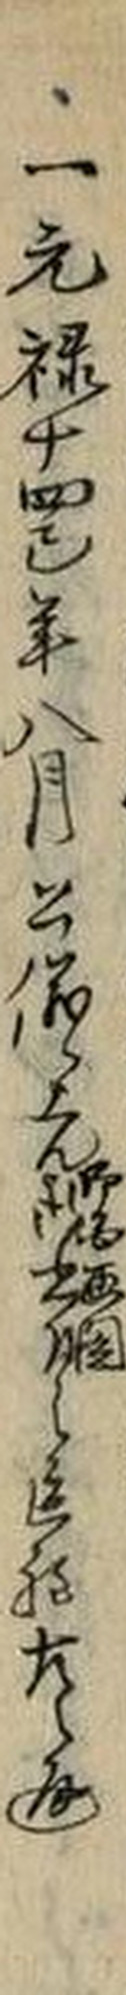一元禄十四巳年八月公儀へ上ル御国絵図御書付之道程左之通
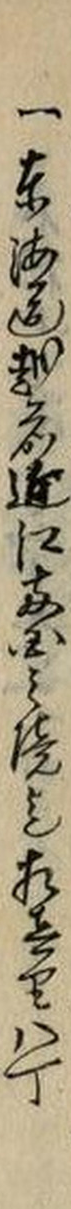一東海道越前近江両国之境迄拾壱里八丁
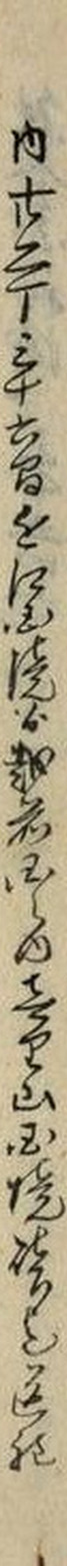内廿二丁三十六間近江国境ゟ越前国之内壱里山国境峠迄道程
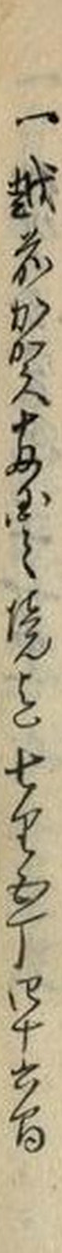一越前加賀両国之境迄七里五丁四十六間
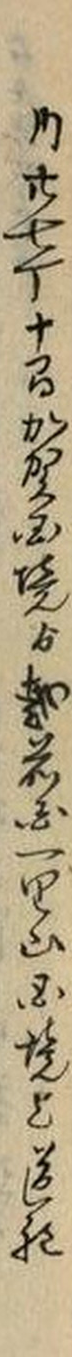内廿七丁十間加賀国境ゟ越前国一里山国境迄道程
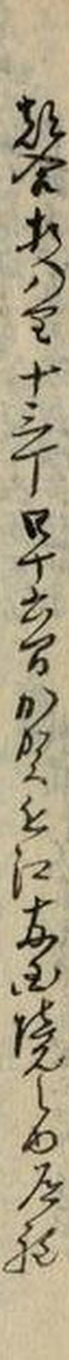都合拾八里十三丁四十六間加賀近江両国境之内道程
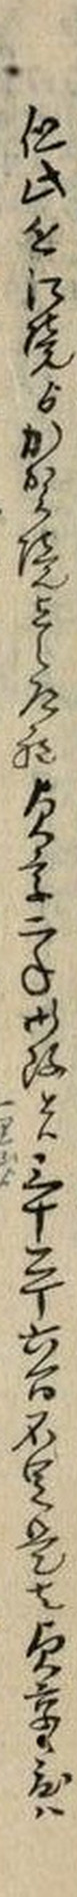但此近江境ゟ加賀境迄之道程貞享二年御改とハ三十二丁六間不足是者貞享之度ハ
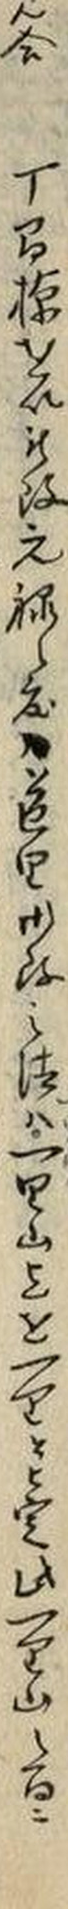丁間棹を以被改元禄之度ハ道里御改之法ハ一里山ゟ一里山迄を一里と被定此一里山之間ニ
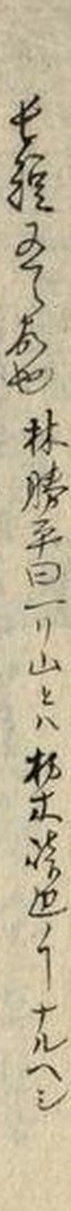長短有之故也林勝平曰一リ山とハ栃木峠辺ノ事ナルヘシ
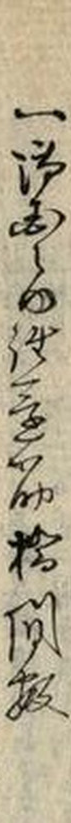一御国之内往還筋橋間数
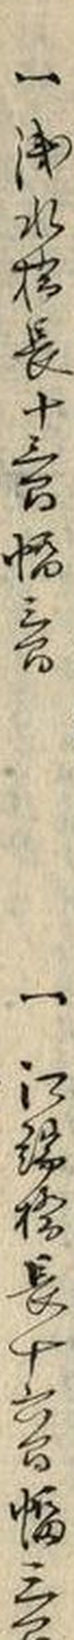一浅水橋長十三間幅三間一江端橋長十六間幅三間
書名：御国他国諸事之部
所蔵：福井県文書館 Fukui Prefectural Archives
